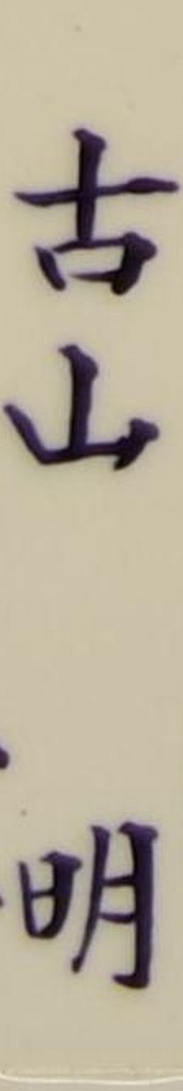古山明
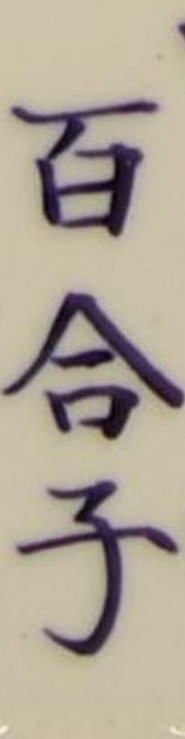百合子
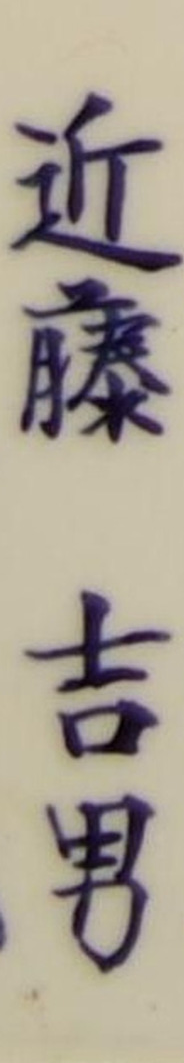近藤吉男
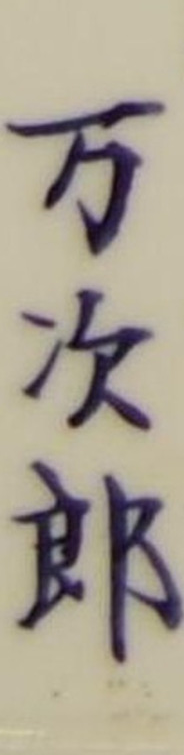万次郎

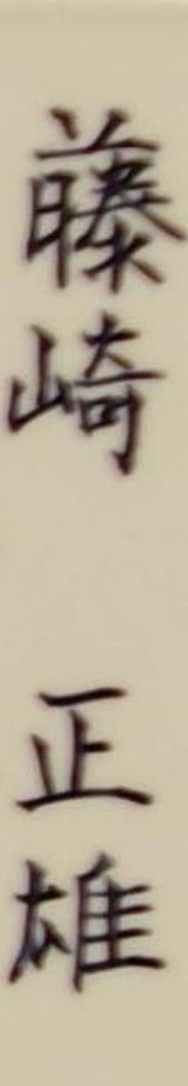藤崎正雄
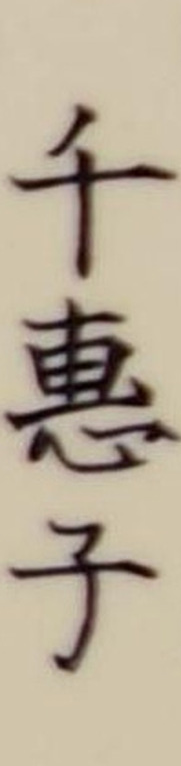千恵子
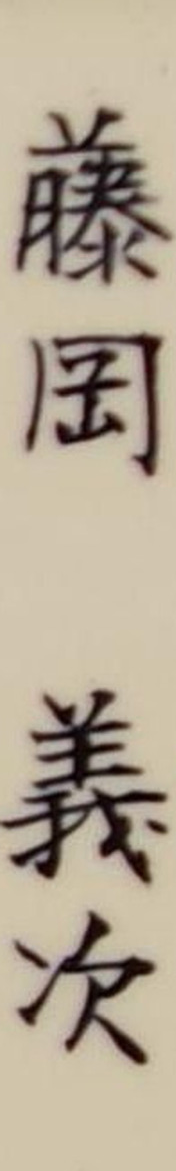藤岡義次
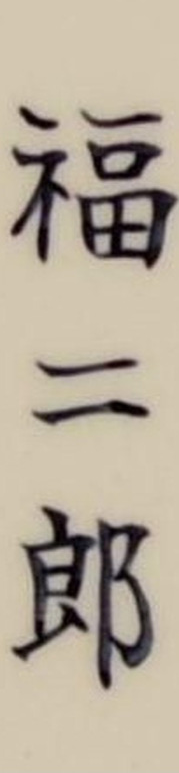福二郎
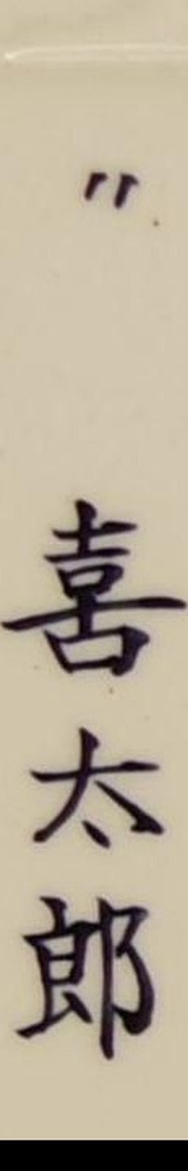喜太郎
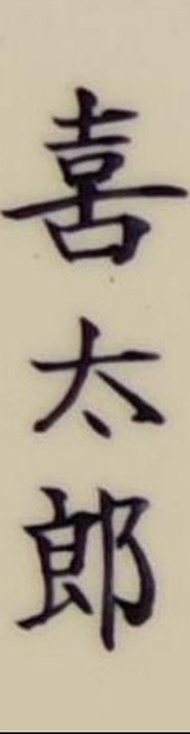喜太郎
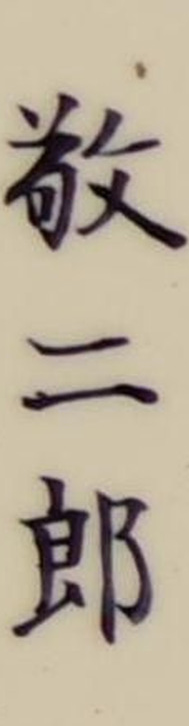敬二郎
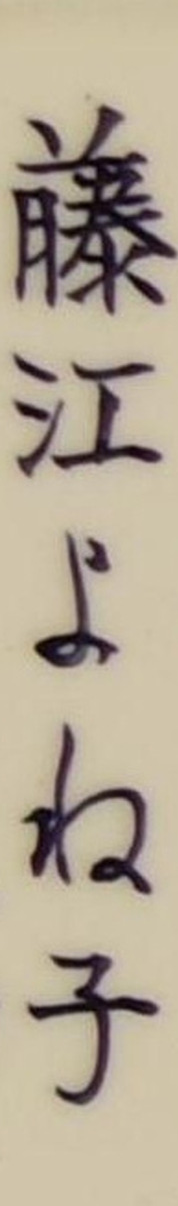藤江よね子
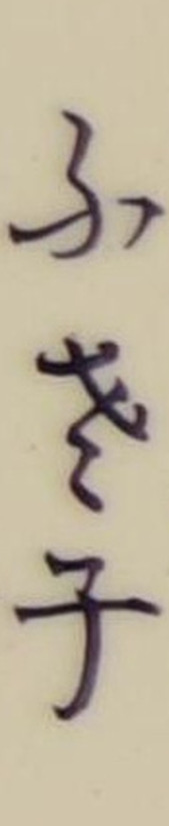ふさ子
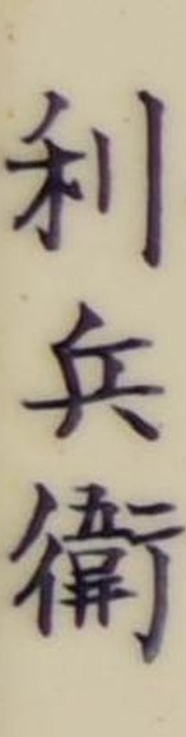利兵衛

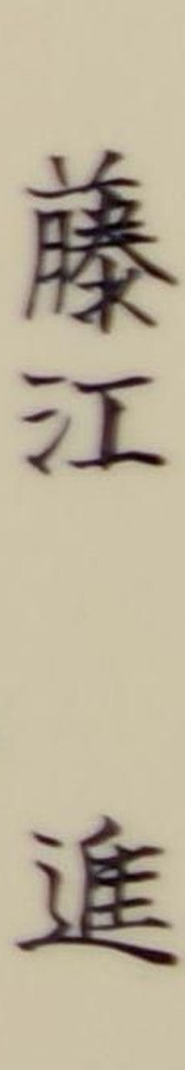藤江進
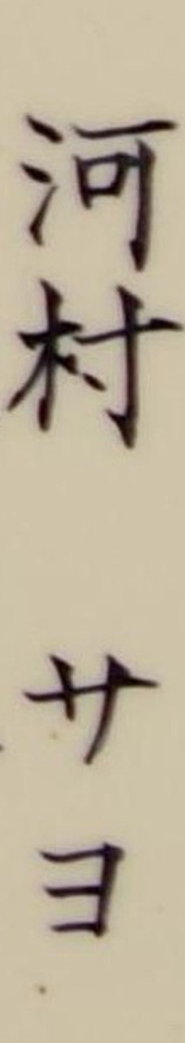河村サヨ
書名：E~L
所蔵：高野山金剛峯寺
